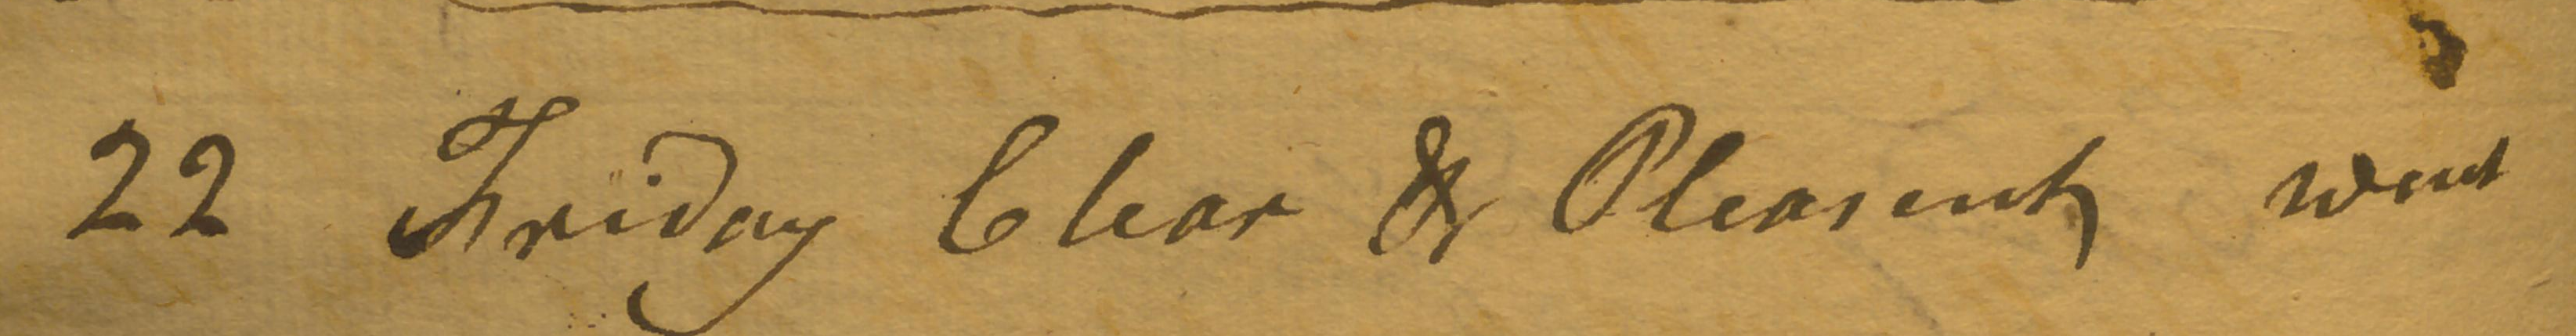22 Friday Clear & Pleasent went
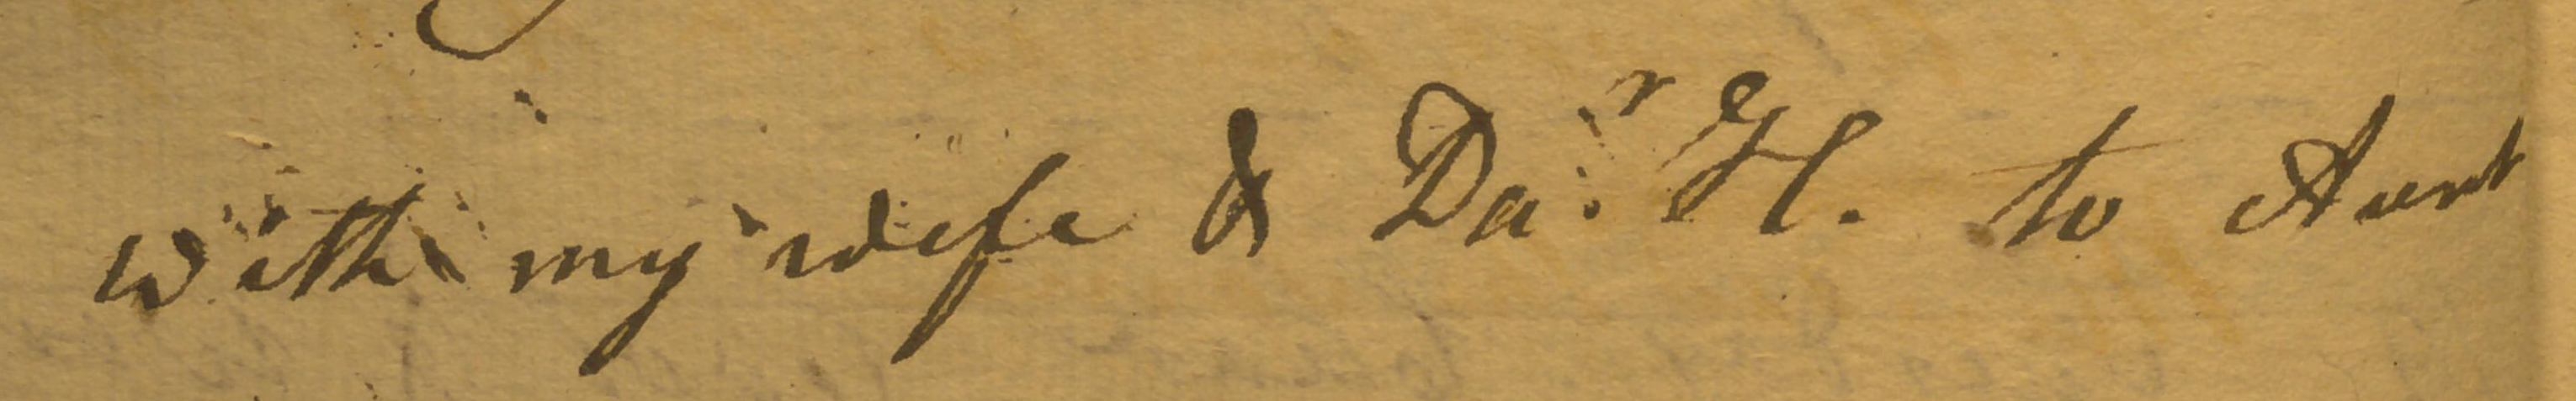with my wife & Da^r. H. to Aunt
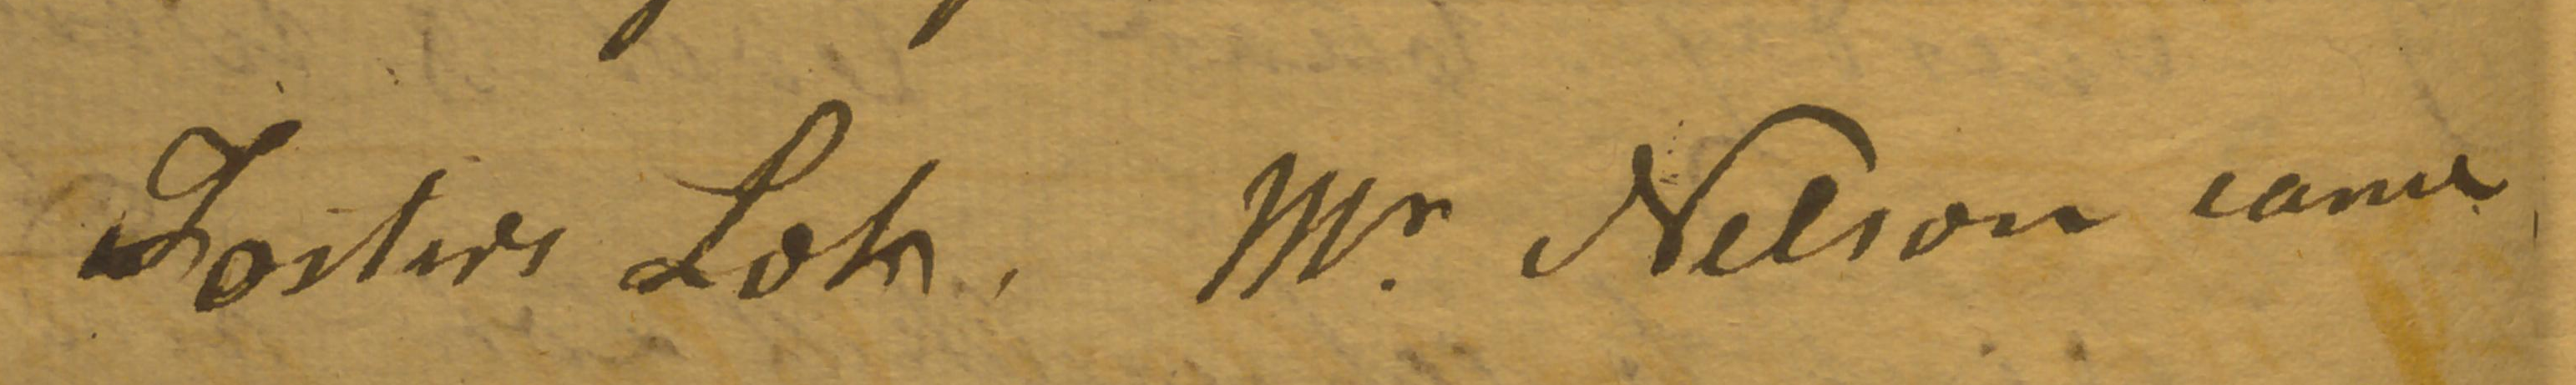Fosters Lot. M^r. Nelson came
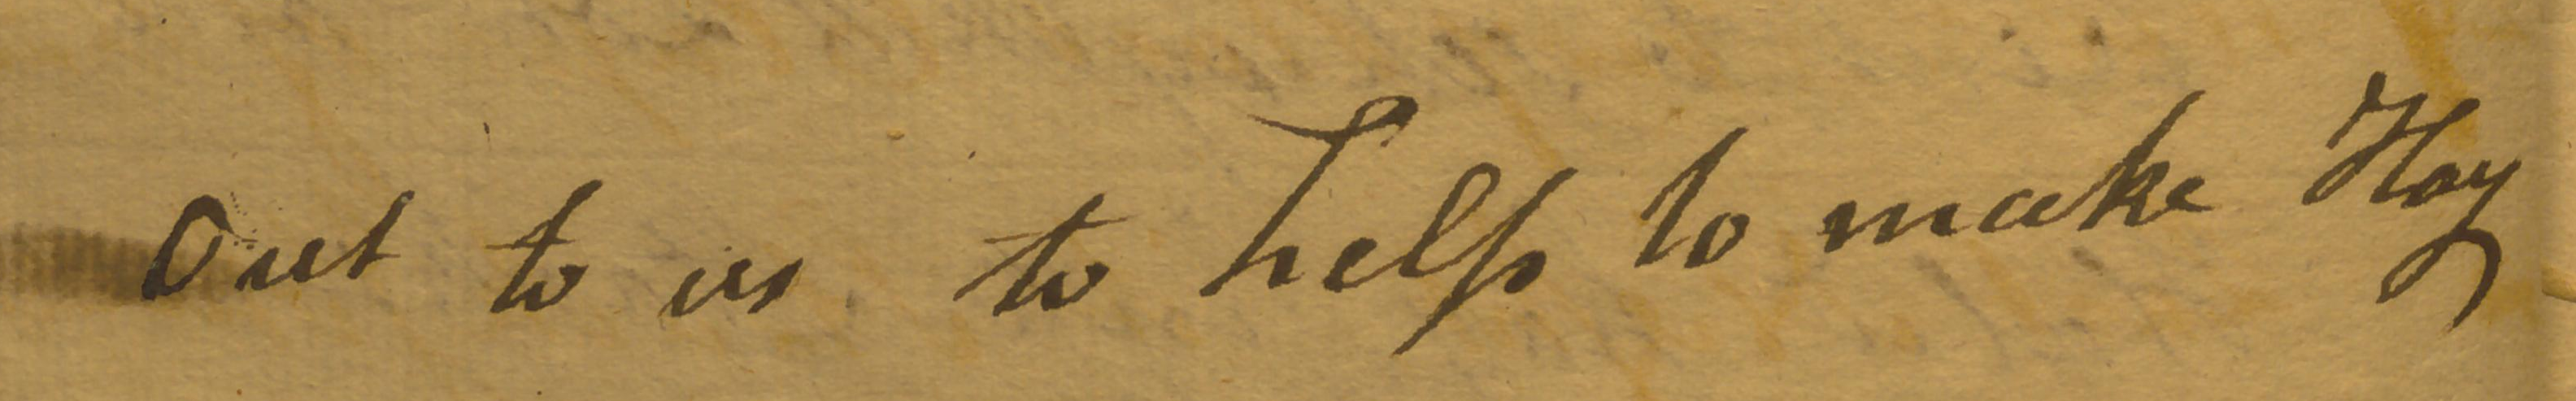out to us to help to make Hay
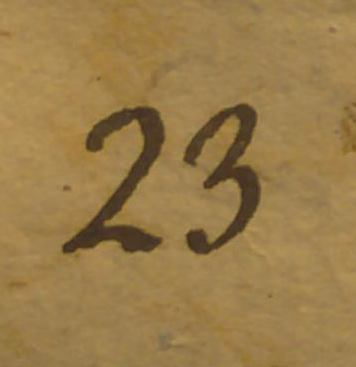23
